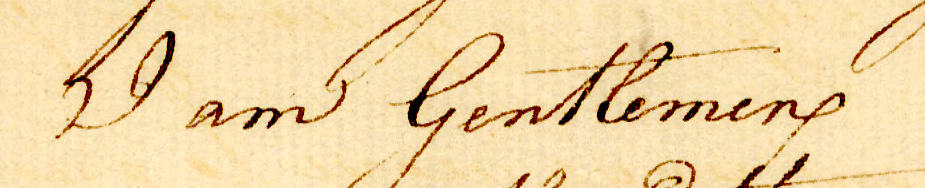I am Gentlemen
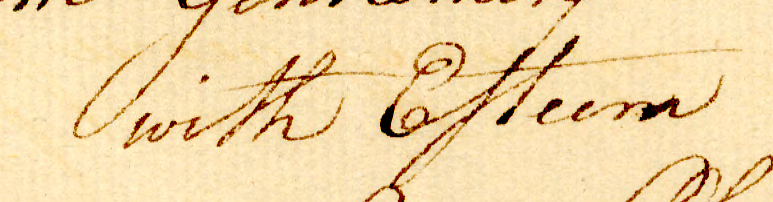with Esteem
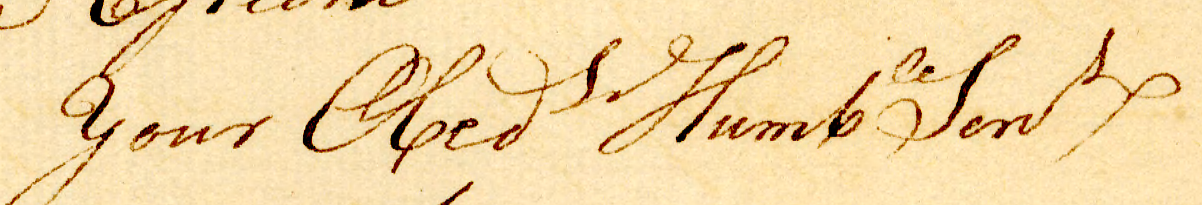Your Obed^t. Humb^le Serv^t
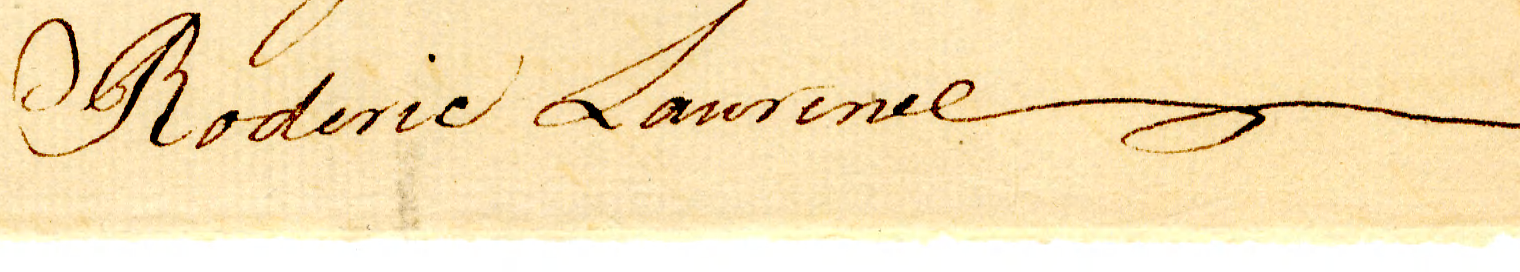Roderic Lawrence
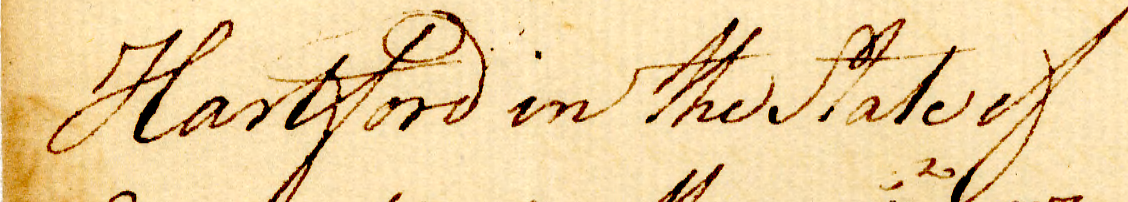Hartford in the State of
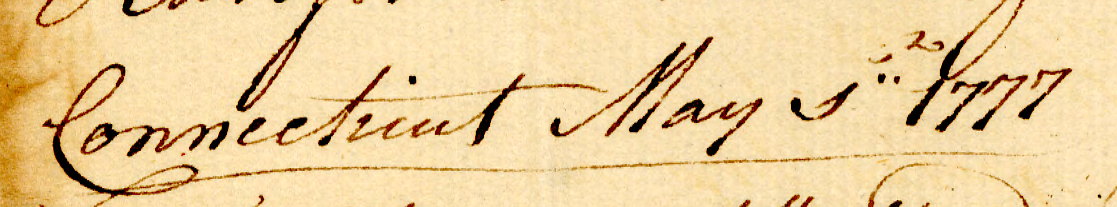Connecticut May 1^st. 1777
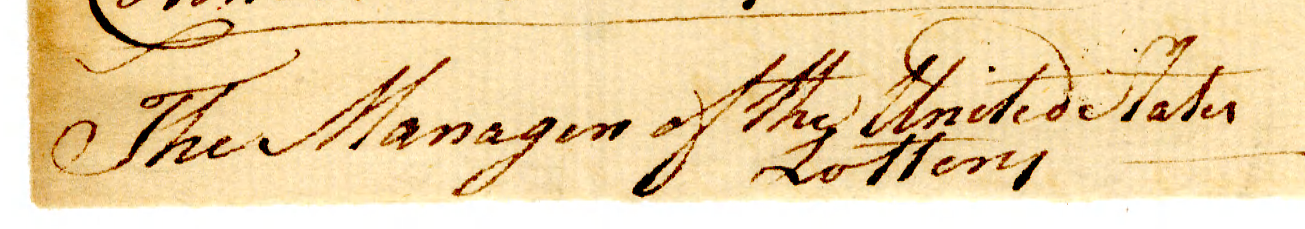The Managers of the United States
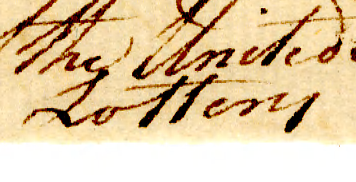Lottery
